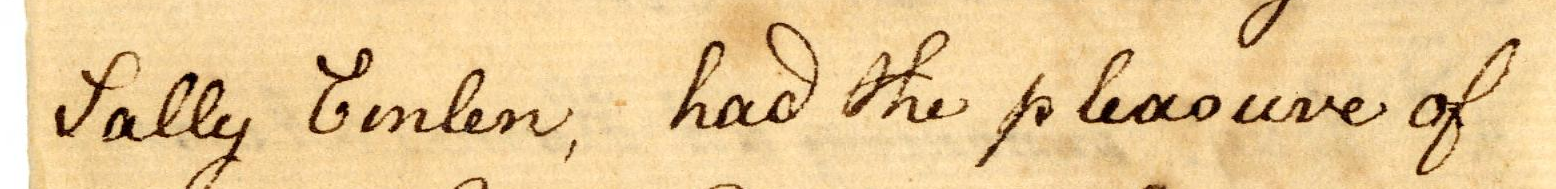Sally Emlen, had the pleasure of
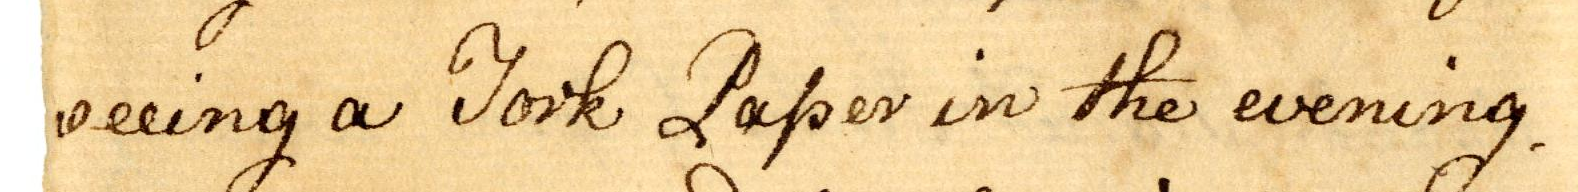seeing a York Paper in the evening.
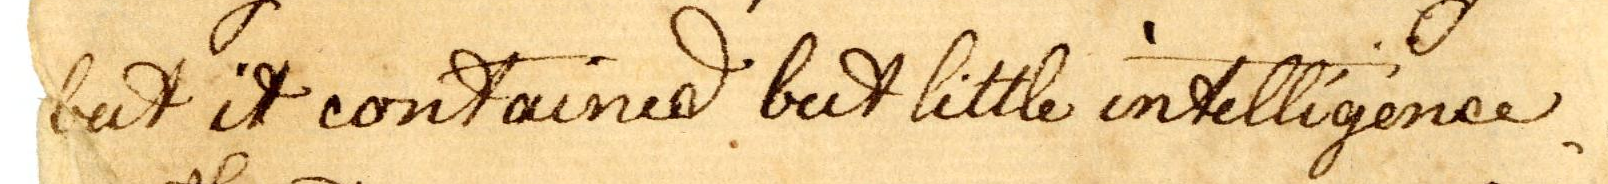but it contained but little intelligence
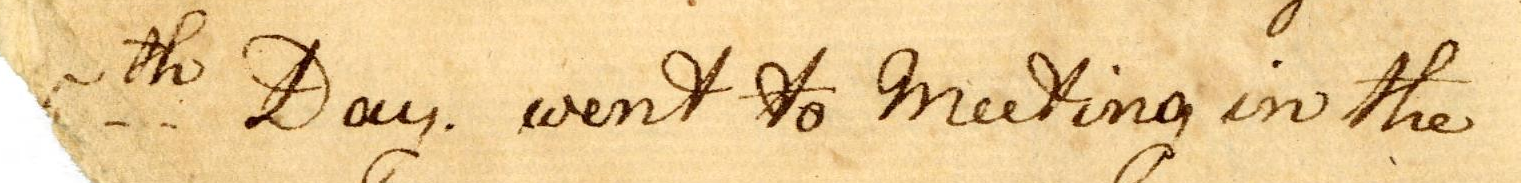5^th Day. went to Meeting in the
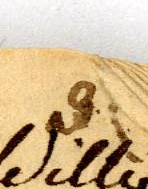3
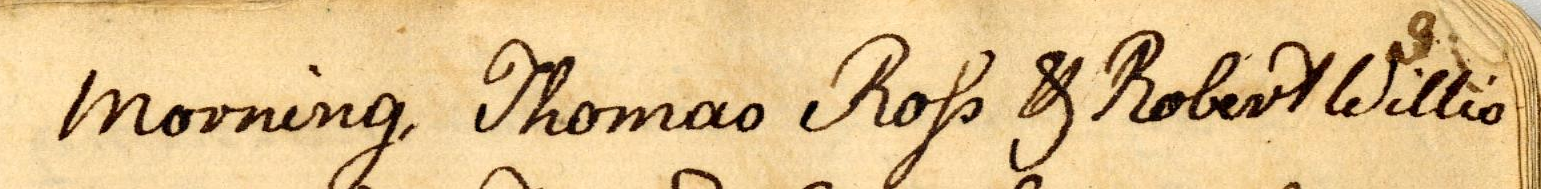Morning, Thomas Ross & Robert Willis
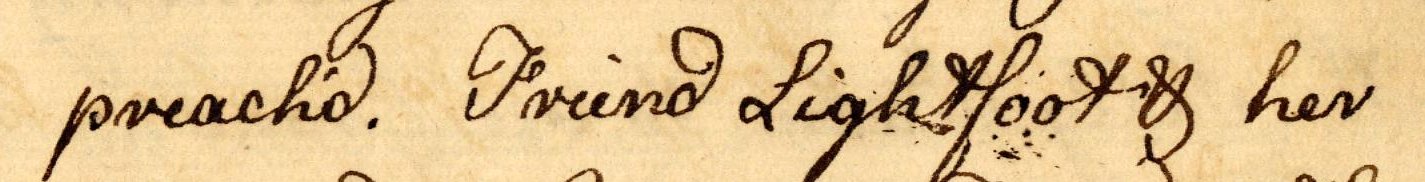preach'd. Friend Lightfoot & her
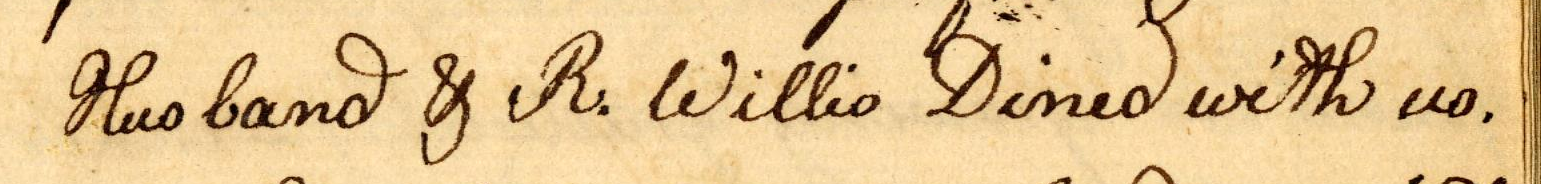Husband & R. Willis Dined with us.
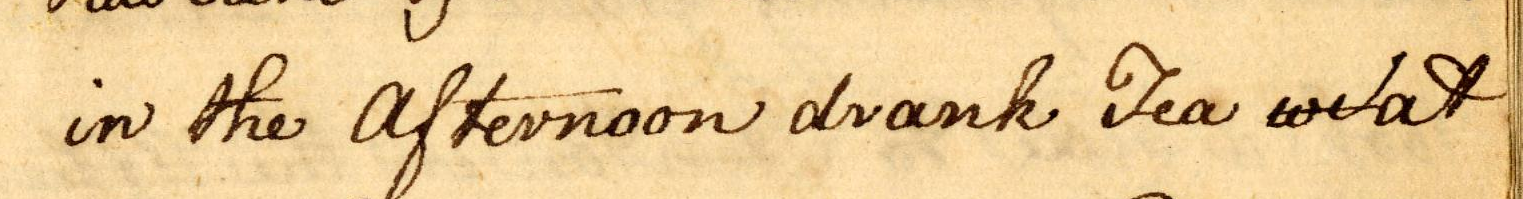in the Afternoon drank Tea [w] at
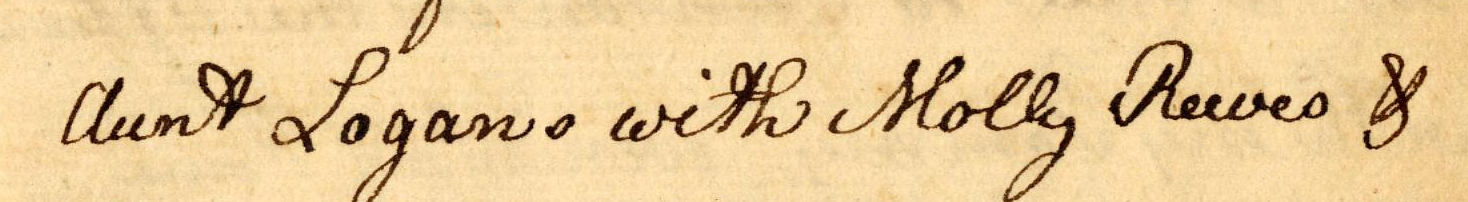Aunt Logans with Molly Reeves &
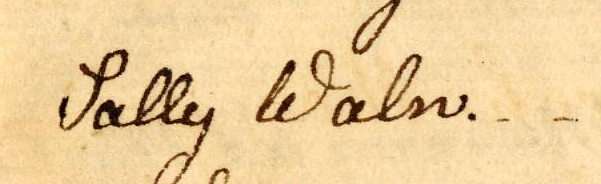Sally Waln.-
